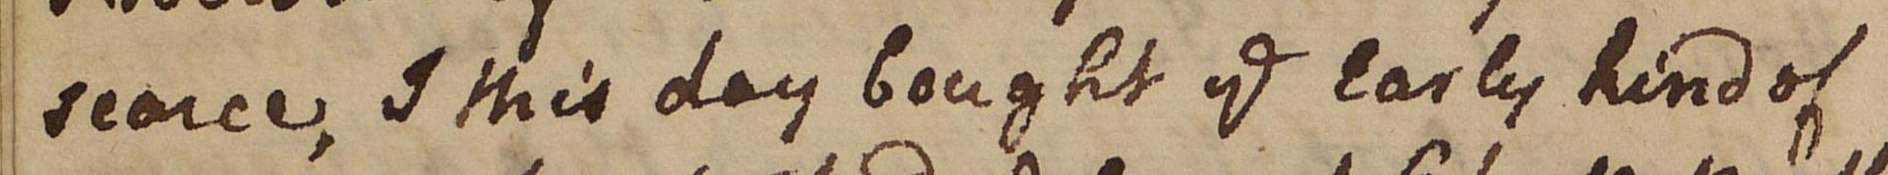scarce, I this day bought y^e Early kind of
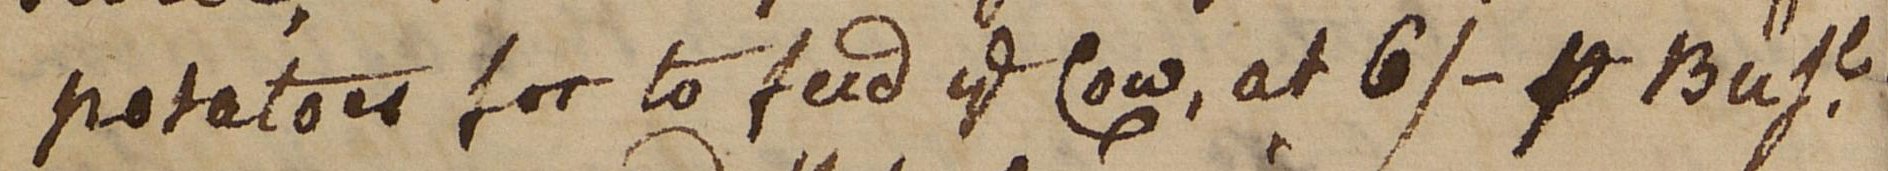potatoes for to feed y^e Cow, at 6s- per Bus^l.
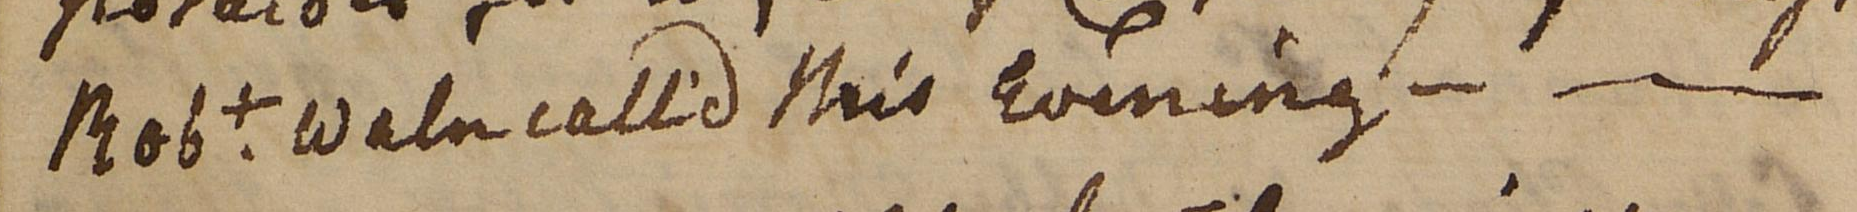Rob^t. Waln call'd this Evening-
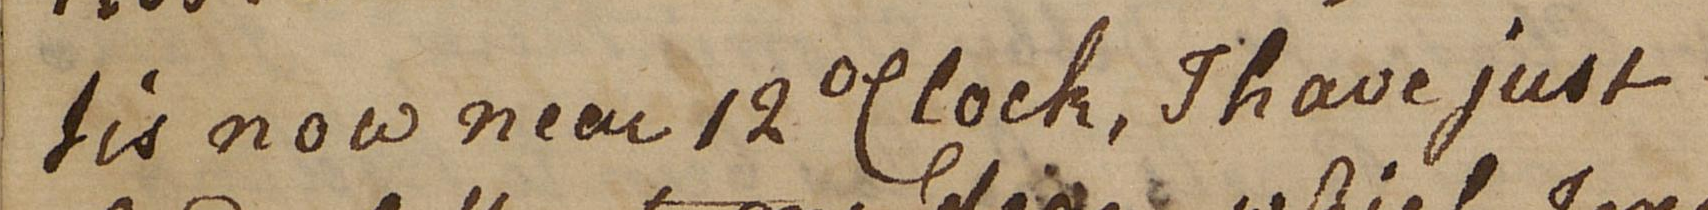tis now near 12 oClock, I have just
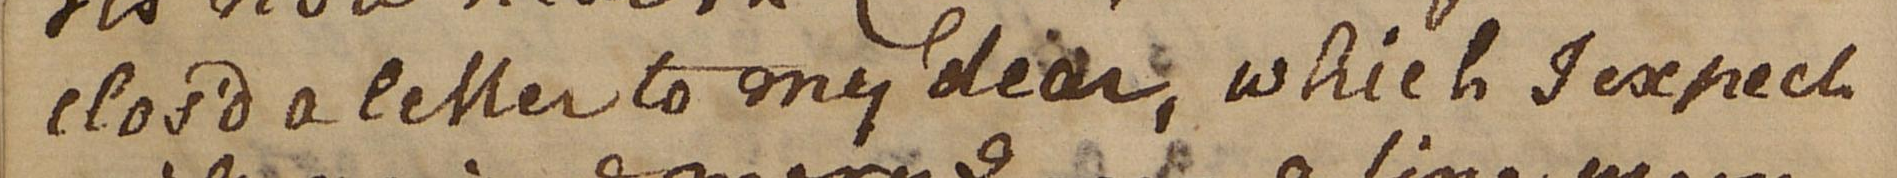clos'd a letter to my dear, which I expect
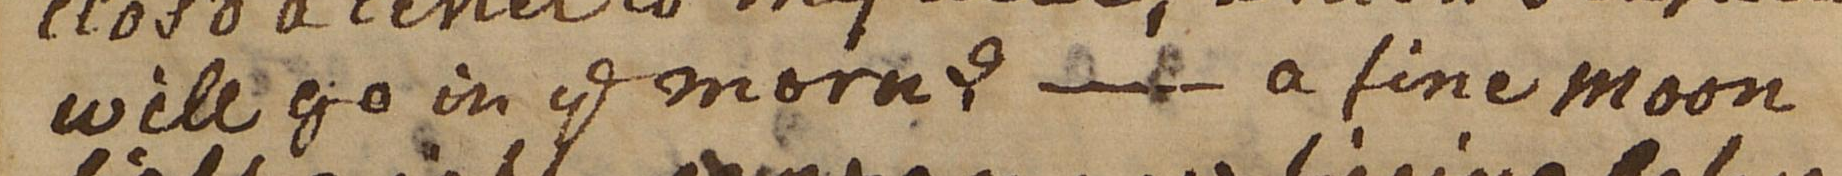will go in y^e morn^g.- a fine moon
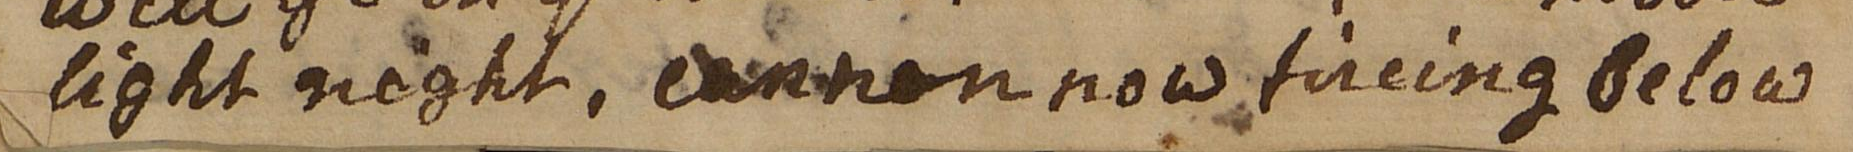light night, cannon now fireing below
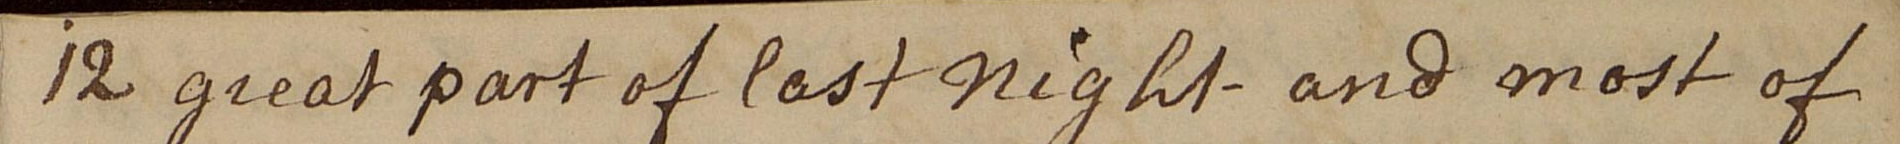12 great part of last night- and most of
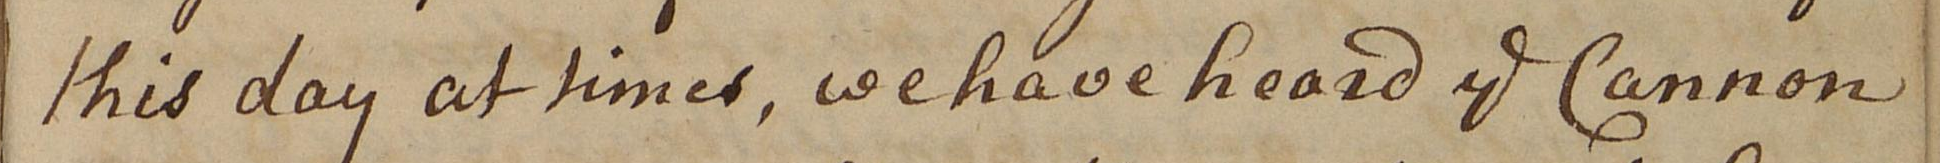this day at times, we have heard y^e Cannon
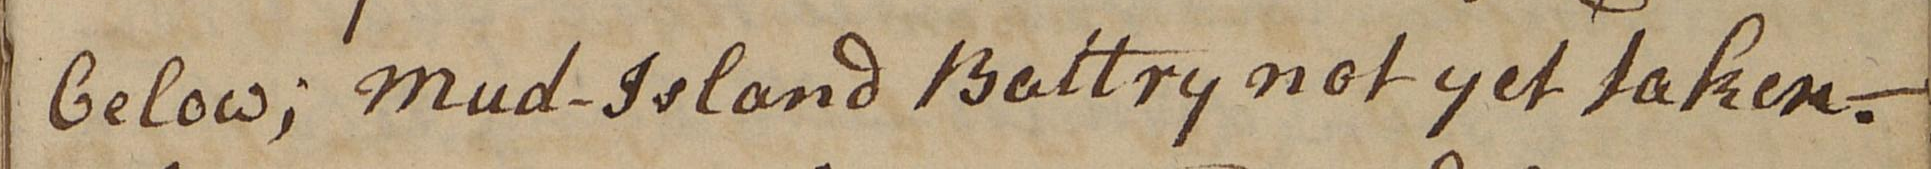below; Mud-Island Battry not yet taken.
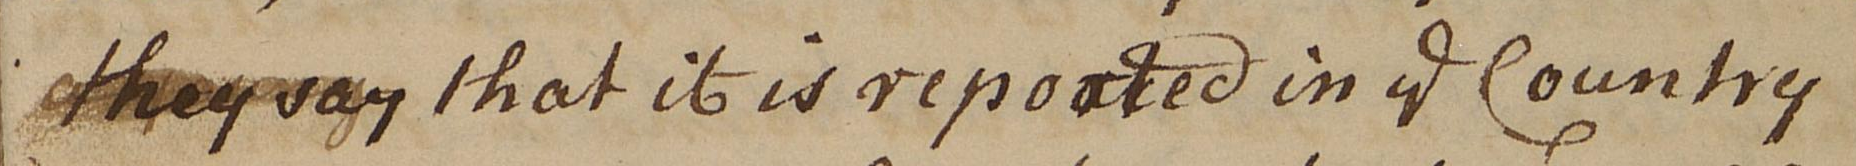they say that it is reported in y^e Country
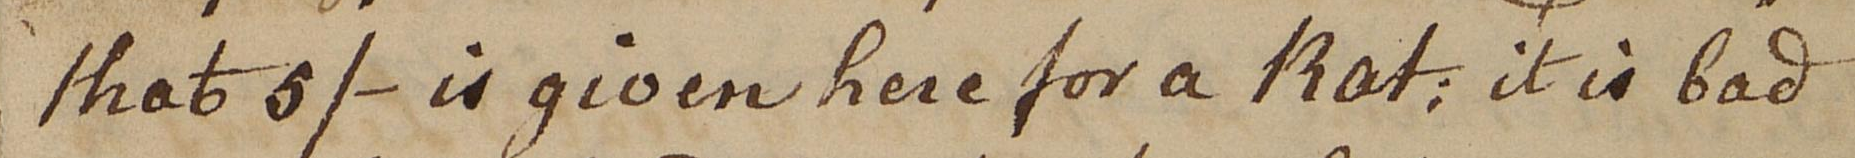that 5s- is given here for a Rat; it is bad
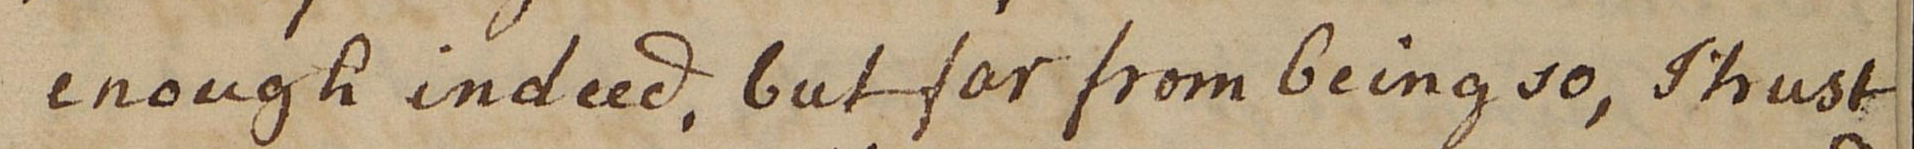enough indeed, but far from being so, I trust
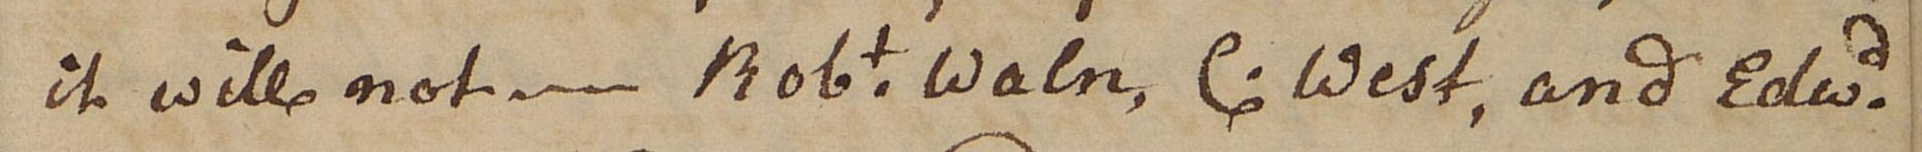it will not- Rob^t. Waln, C. West, and Edw^d.
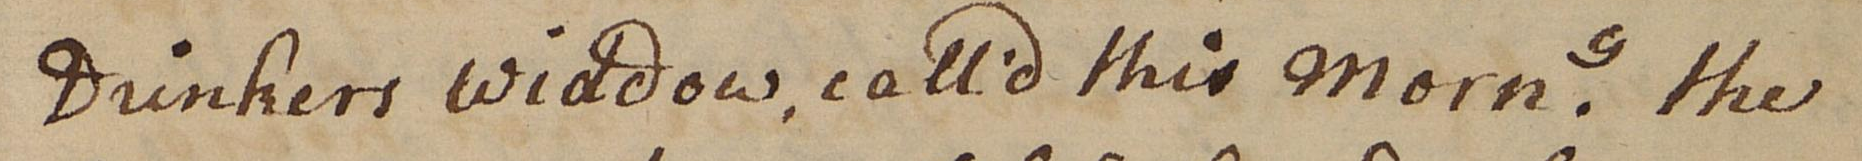Drinkers Widdow call'd this Morn^g. the
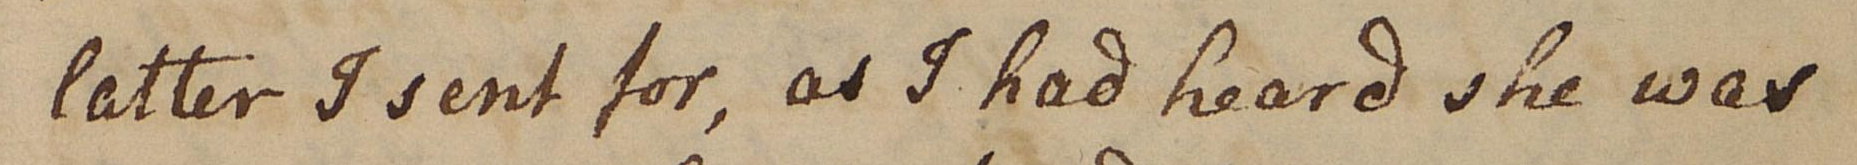latter I sent for, as I had heard she was
